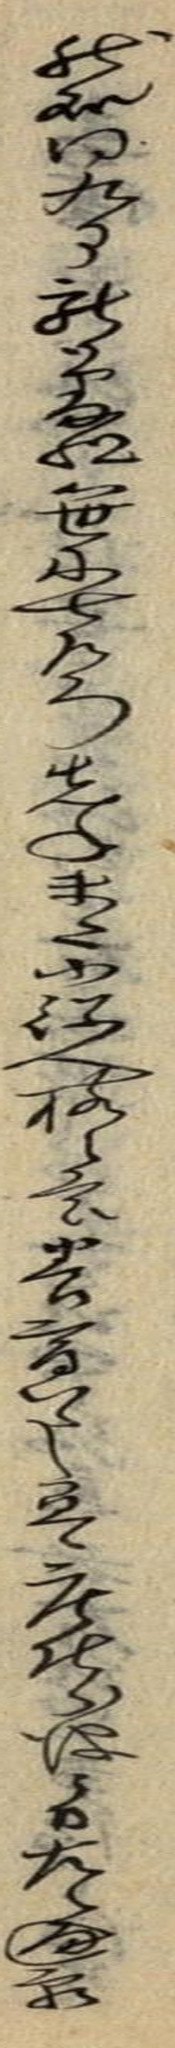然処同九月新御番組笹木七左衛門先年末未た小役人格之節養育いたし置候庄次郎儀ニ付左之通願
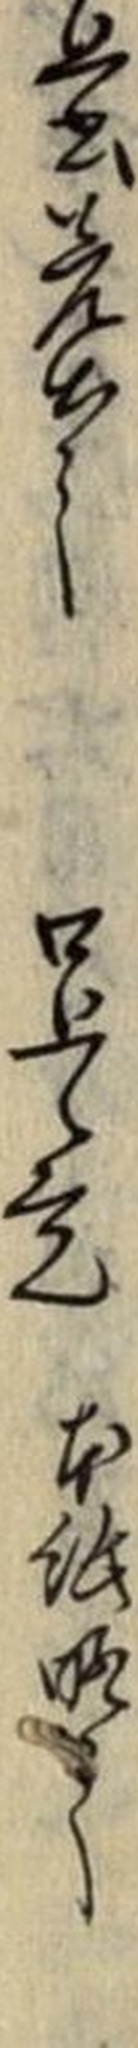口上書差出之口上之覚本紙略之
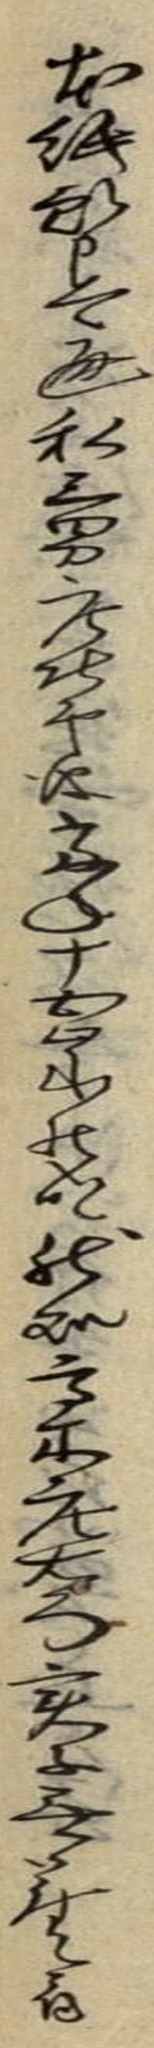本紙願申上候通私三男庄次郎儀当年十五歳罷成候然処高木庄右衛門実子無御座候ニ付
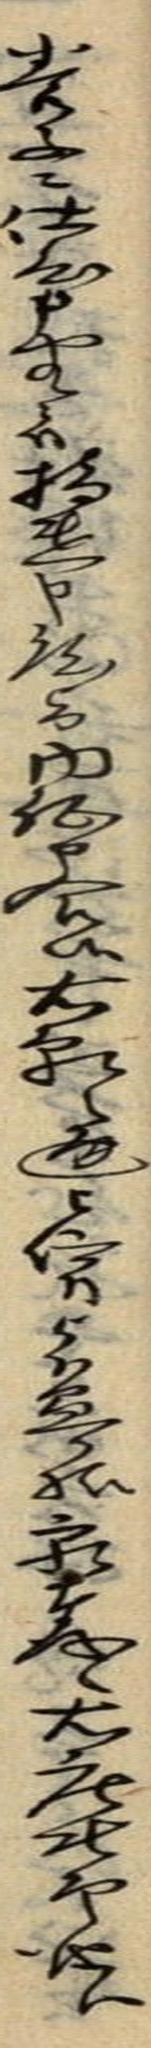養子ニ仕度申聞候ニ付指遣申度旨内証申合候右願之通被仰付被下置候様願奉存候右庄次郎儀ハ
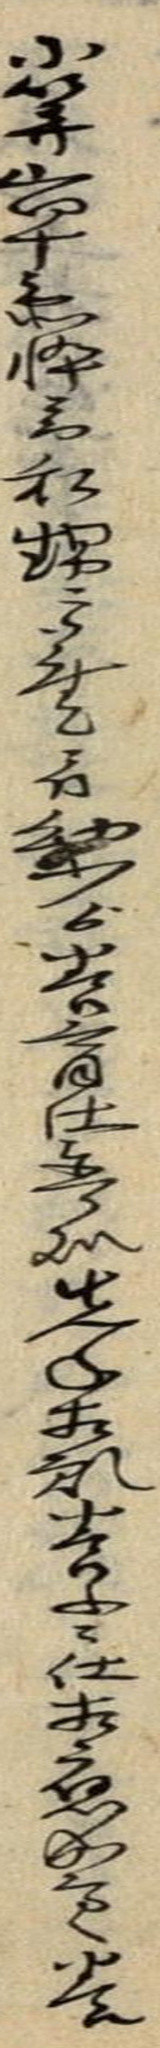小算山田十兵衛忰ニ而私甥ニ御座候ニ付幼少ゟ養育仕置候処先年相願養子ニ仕相応成方へ養
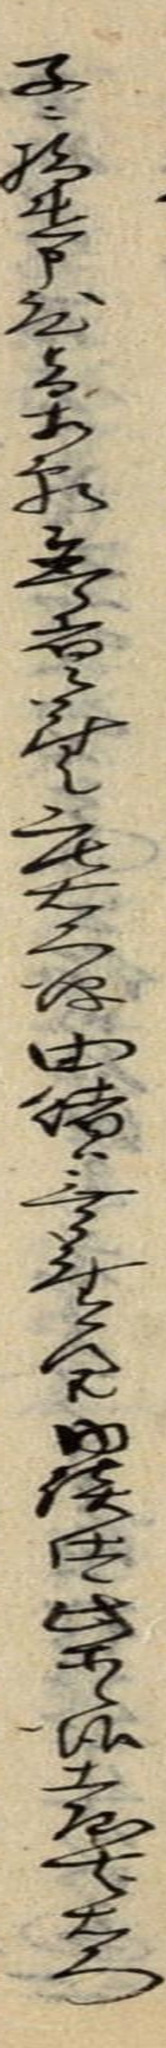子ニ指遣申度旨相願置候者ニ御座候庄右衛門儀由緒ハ無御座候得共内談仕候此等之趣土屋十郎右衛門
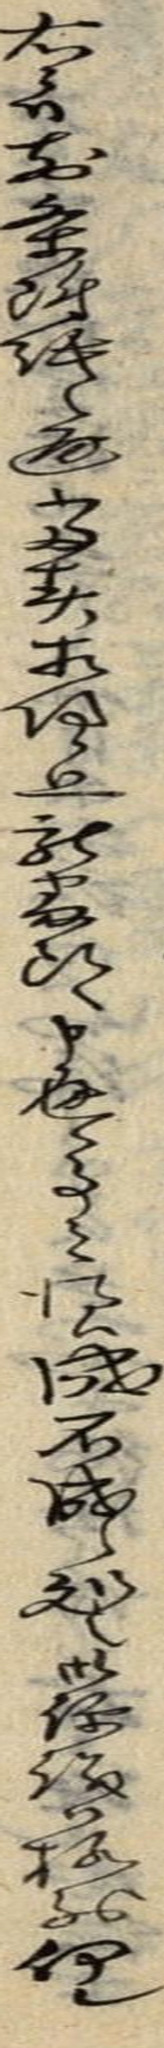右ニ付前条附紙之通当春相伺候上新番頭へ申通候事ニ候得ハ成不成之処之御評儀は格別何レ
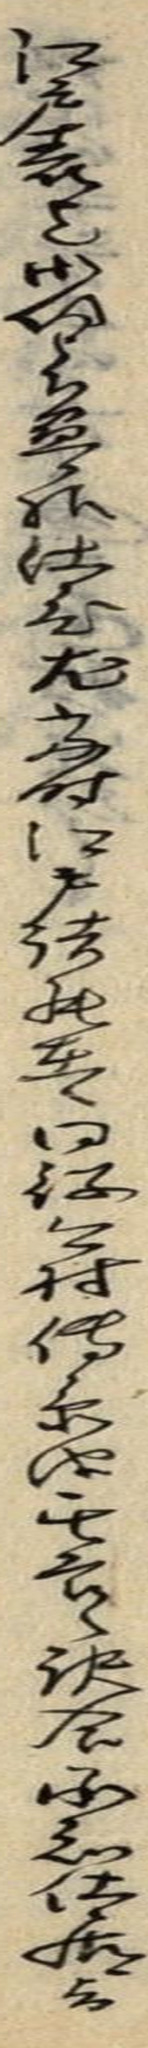江戸表迄御伺被下置候様仕度尤当時江戸詰罷在候同役今村伝兵衛儀其節之訳合承知仕居候旨
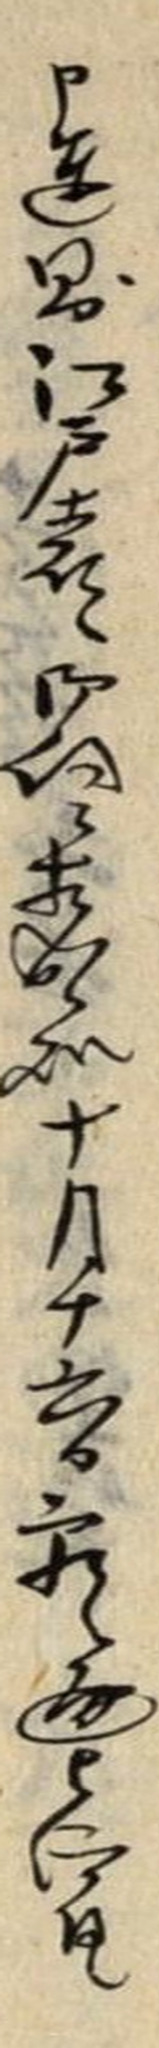申達則江戸表へ御伺ニ相成候処十月十六日願之通被仰付候
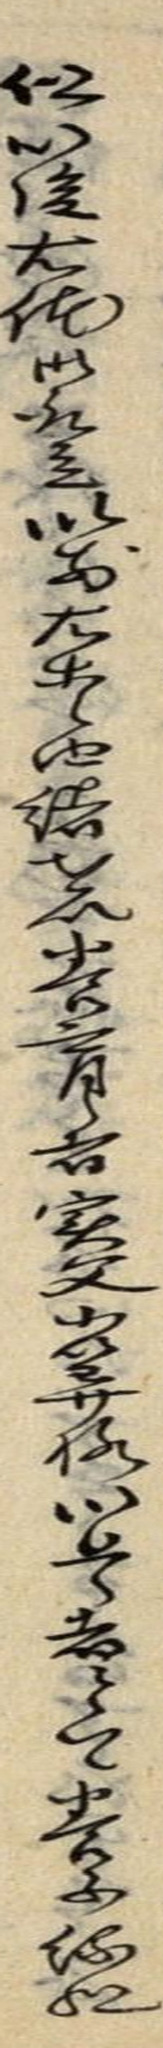但以後右体御取立以前右等之由緒を以養育之者実父小算格以上之者ニ候ハヽ養子縁組
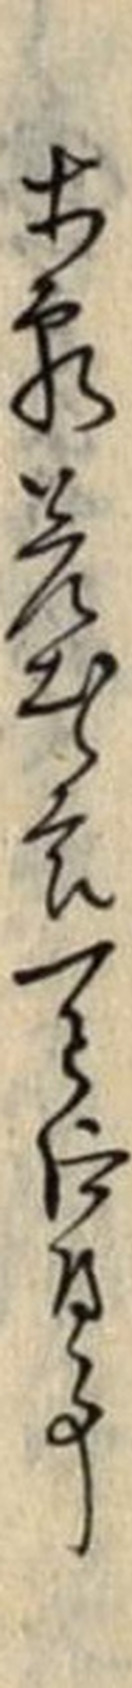相願差出候節可被仰付事
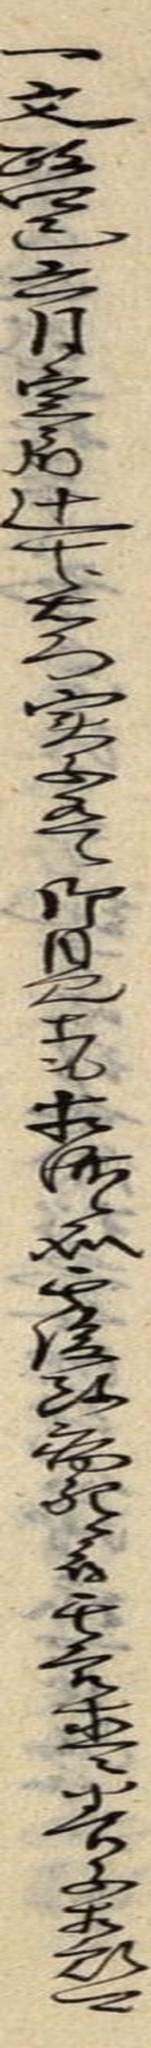一文政四巳六月定府辻十郎右衛門実子有之御目見等も相済候処其後致病死候ニ付其節直ニ養子相願可
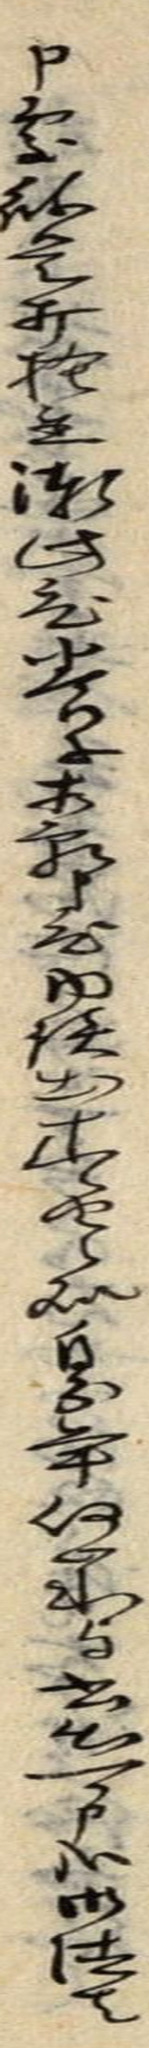申処彼是打捨置漸此度養子相願申度内談出来候由之処自分年何歳与書出可申哉御法は
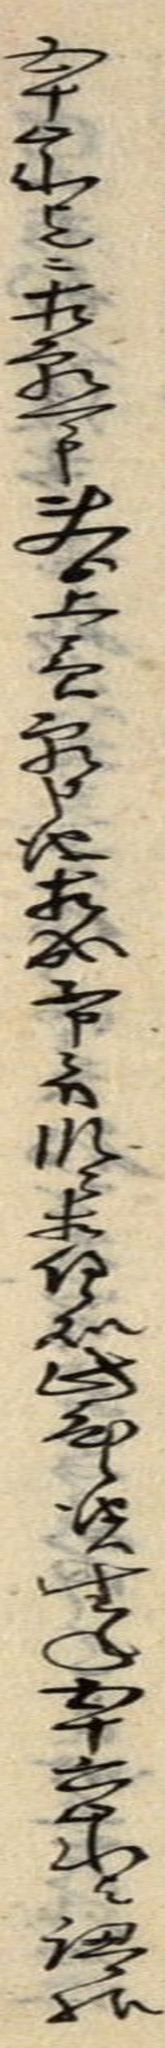五十歳迄ニ相願可申夫ゟ上ニ而ハ願申儀相成不申ニ付段々相伺候処此度之儀ハ生年五十六歳与認候様
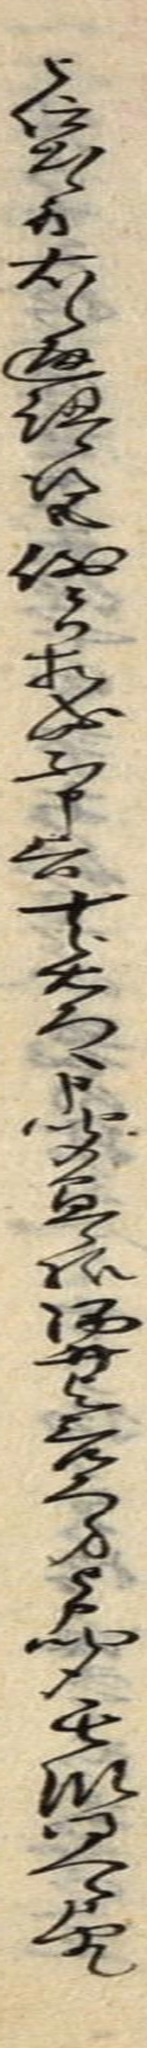被仰出候ニ付右之通認候得共例ニハ相成不申旨十郎右衛門へ申聞置候様酒井与三左衛門方被申聞其段同人へ申聞候
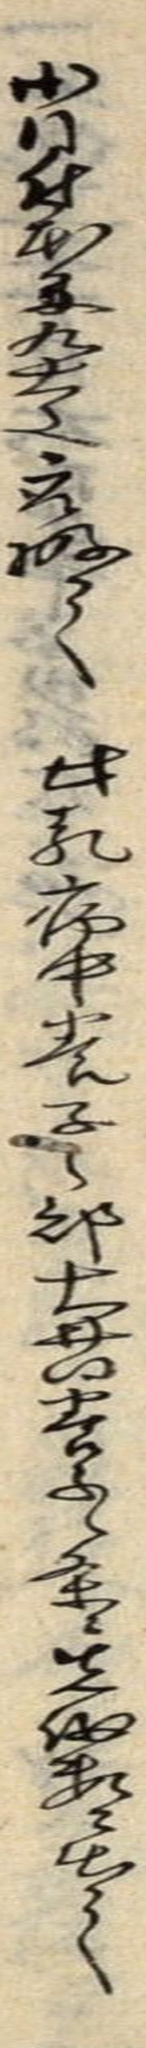御目付本多九大夫取扱之此類病中養子之部大井田養子之条ニ先例数々出候之
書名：養子縁組之部
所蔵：福井県文書館 Fukui Prefectural Archives
